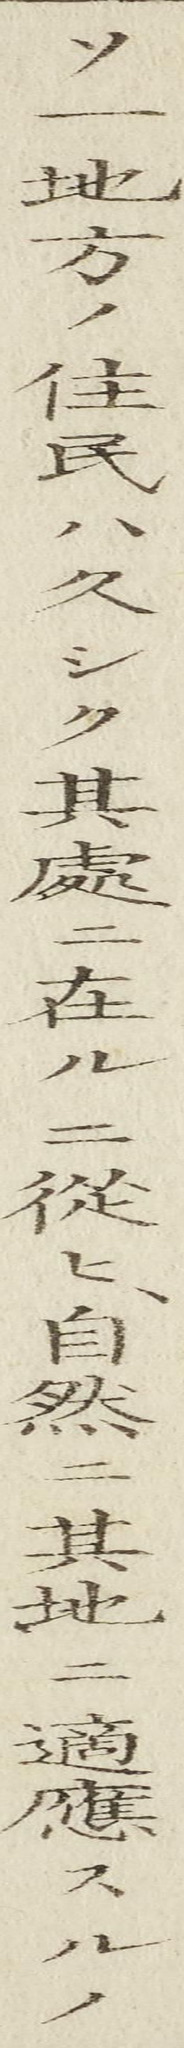ソ一地方ノ住民ハ久シク其処ニ在ルニ従ヒ、自然ニ其地ニ適応スルノ
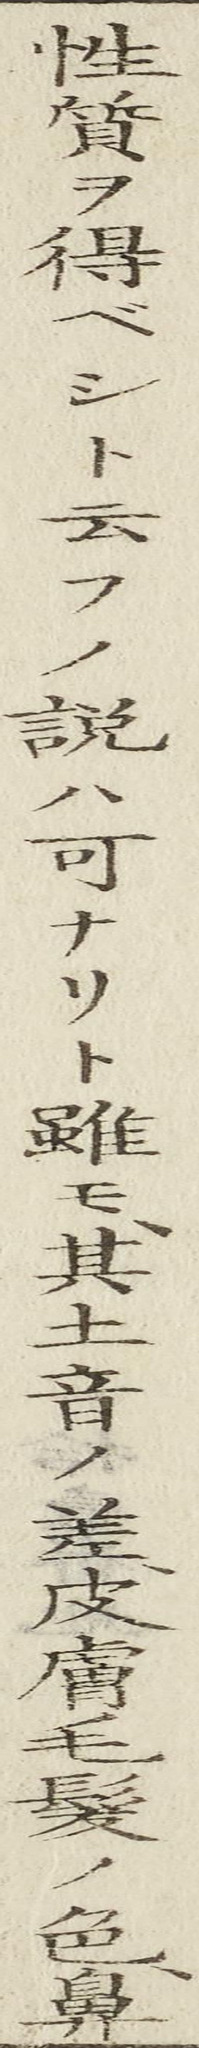性質ヲ得ベシト云フノ説ハ可ナリト雖モ、其土音ノ差、皮膚毛髪ノ色、鼻
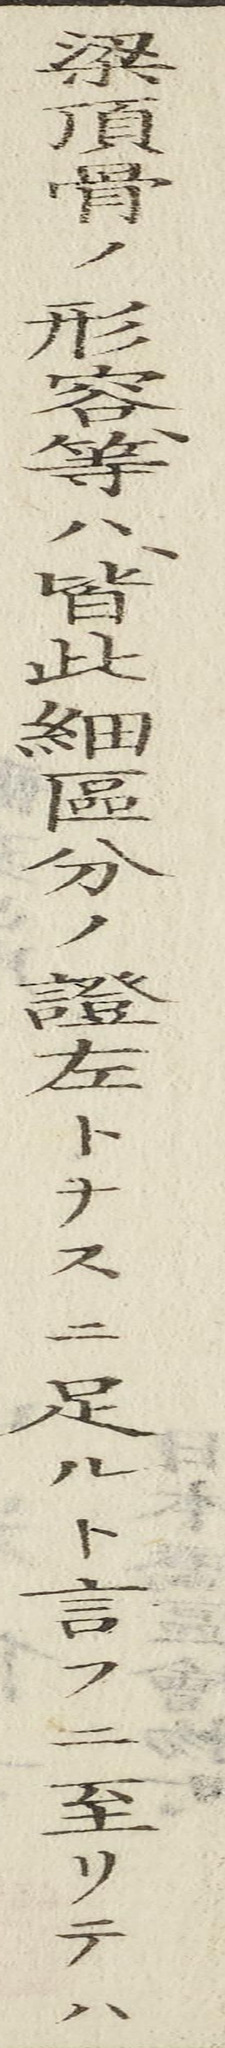梁頂骨ノ形容、等ハ、皆此細区分ノ証左トナスニ足ルト言フニ至リテハ
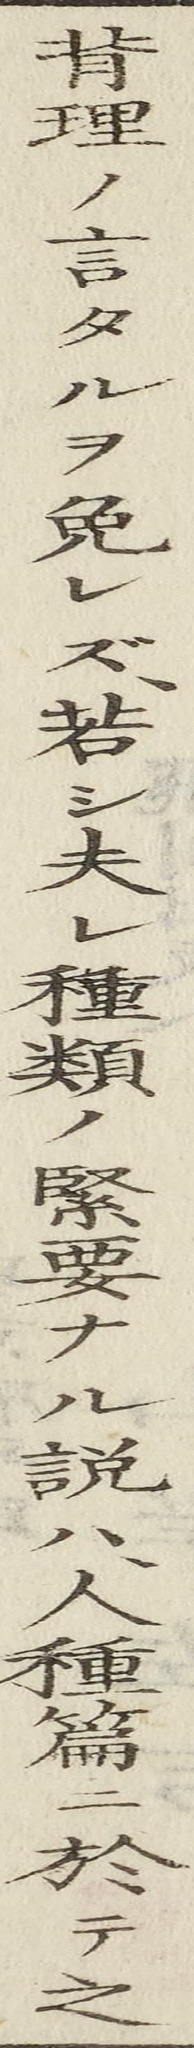背理ノ言タルヲ免レズ、若シ夫レ種類ノ緊要ナル説ハ、人種篇ニ於テ之
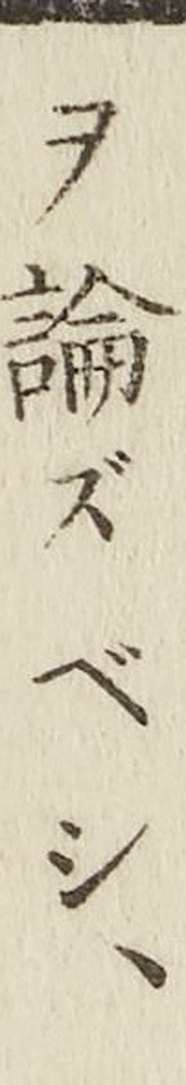ヲ論ズベシ、
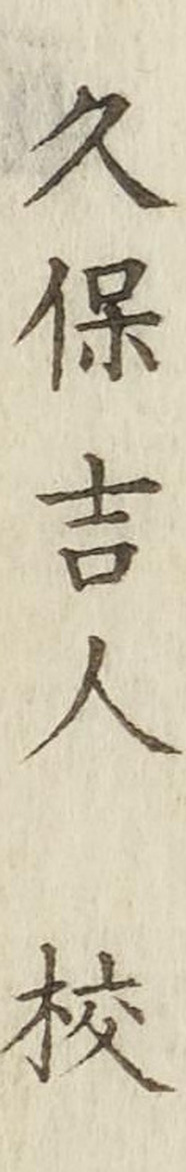久保吉人校

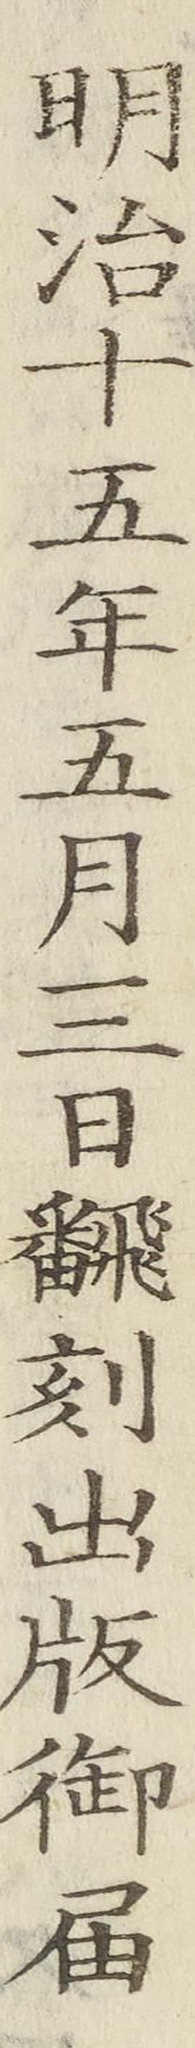明治十五年五月三日飜刻出版御届
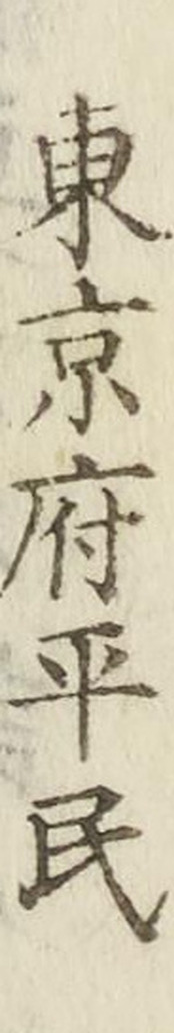東京府平民
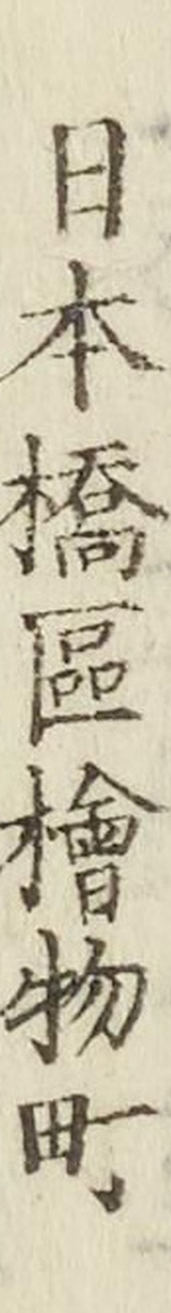日本橋区桧物町
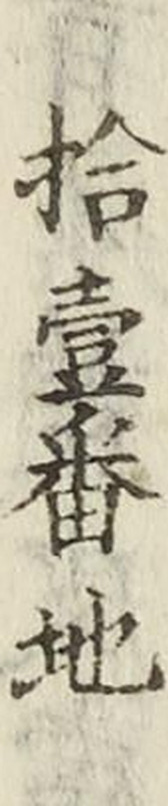拾壱番地
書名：百科全書　地文學　全
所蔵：東京大学地震研究所図書室 Earthquake Research Institute Library, The University of Tokyo, JAPAN
